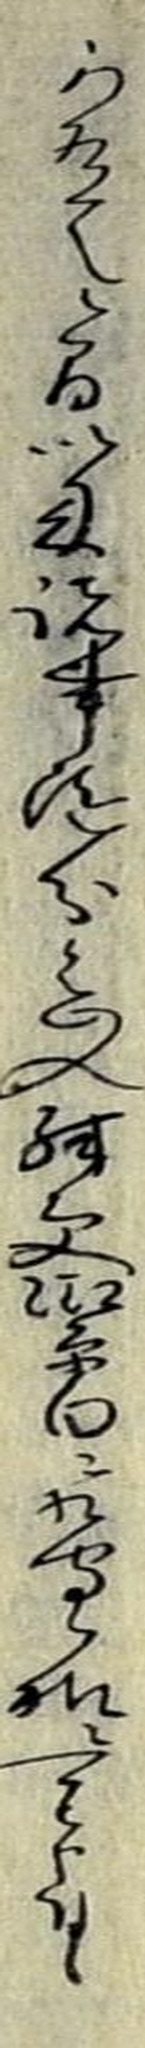可有之候間以来諸事随分念入殊更潔白ニ相守候様ニ可被申付候
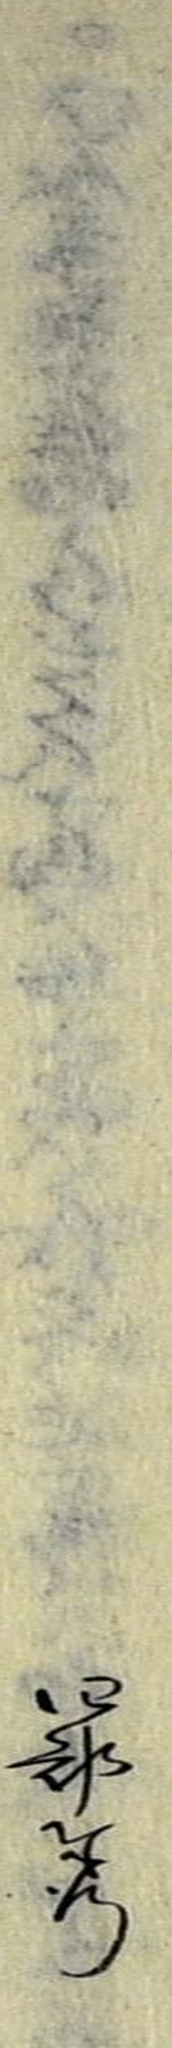四郡奉行
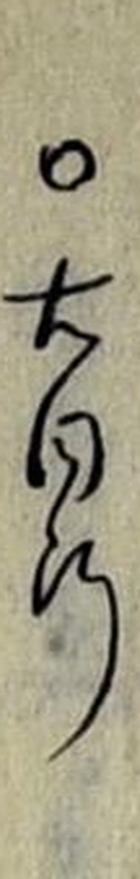〇右同断
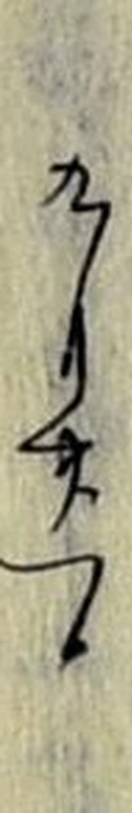九月廿一日
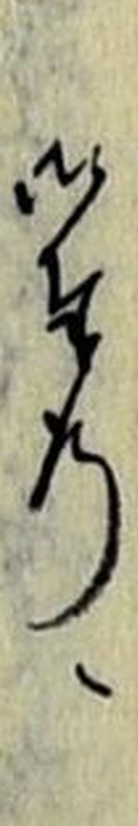御奉行へ
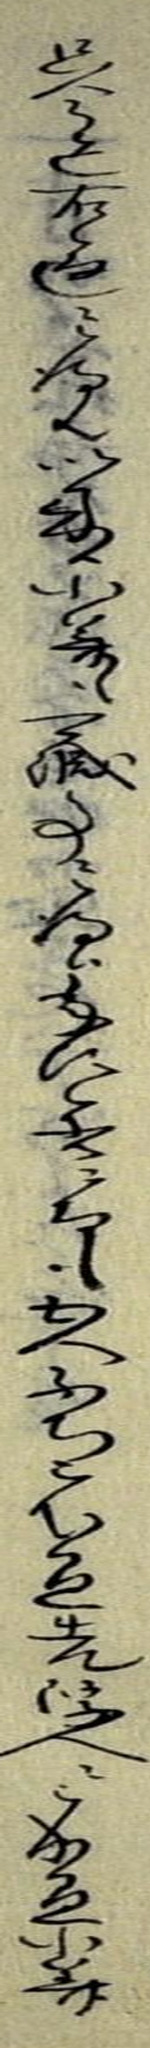只今迄右之通ニ候得共以来ハ小算も可減事ニ候得ハ年頃之者ニ而も五人扶持被下置先浮人ニ被成置小算
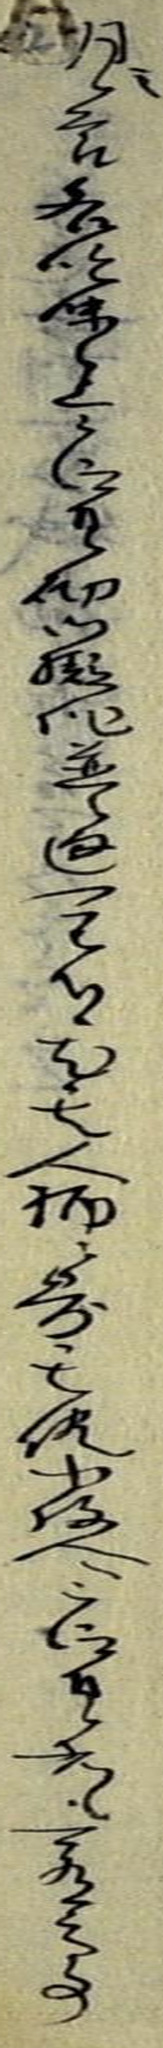明之節各吟味之上被仰付候砌御擬作並之通可被下候尤其人柄ニ寄其儘小役人へ被仰付候者も可有之事
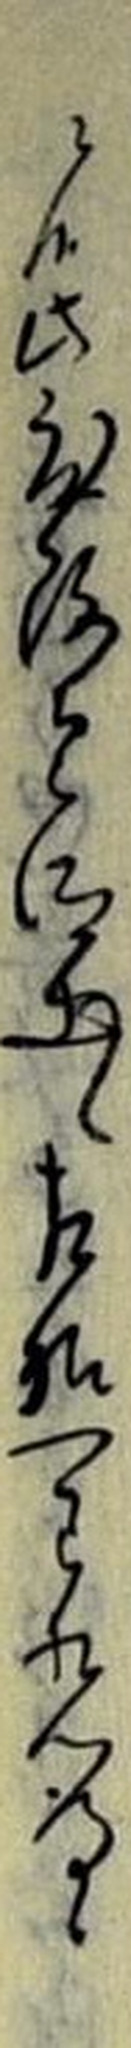ニ候此度改而被仰出候左様可被相心得候
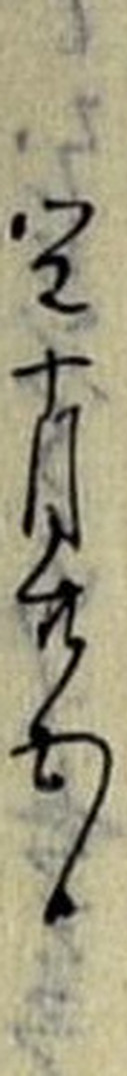閏十月廿五日
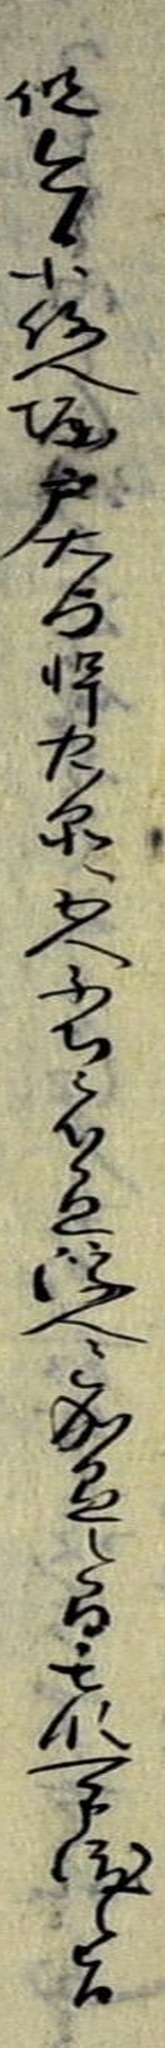但今日小役人堀戸右衛門忰忠兵衛五人ふち被下置浮人ニ被成置候間其段可申渡之旨
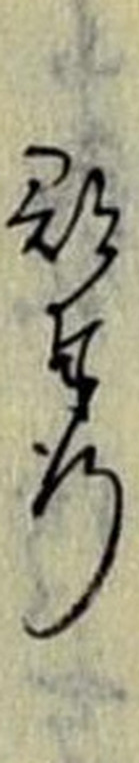郡奉行
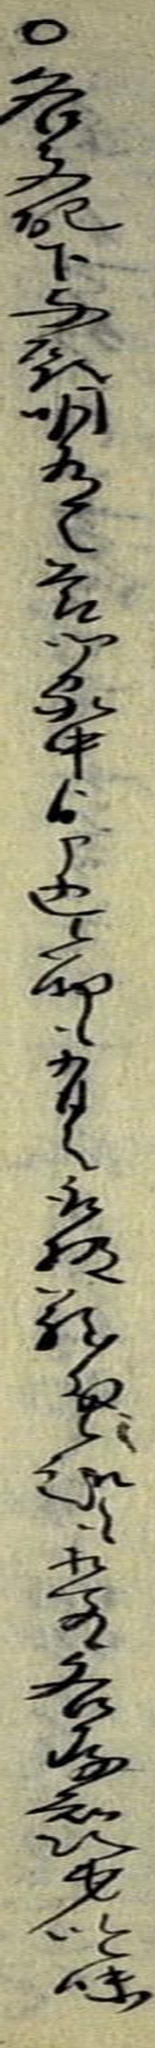〇各支配下与頭明有之節御家中ゟ申込之筋も有之取扱難義之趣も相聞候各存知次第吟味
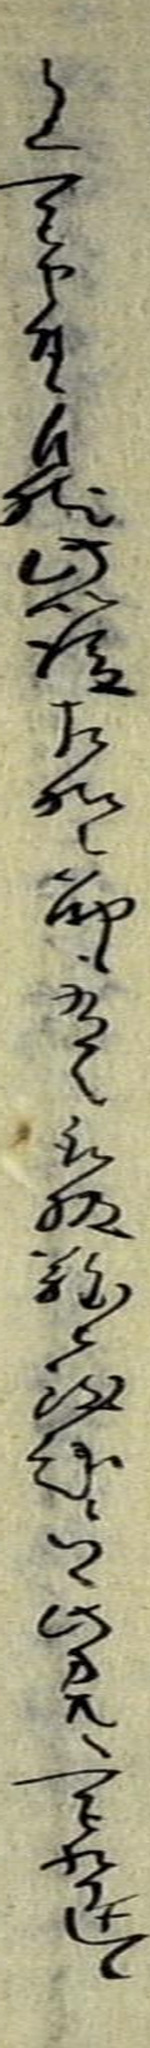之上可被申付候自然此以後左様之筋も有之取扱難被致趣候ハヽ此方共へ可被相達候
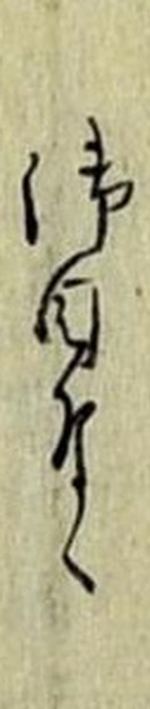御目付へ
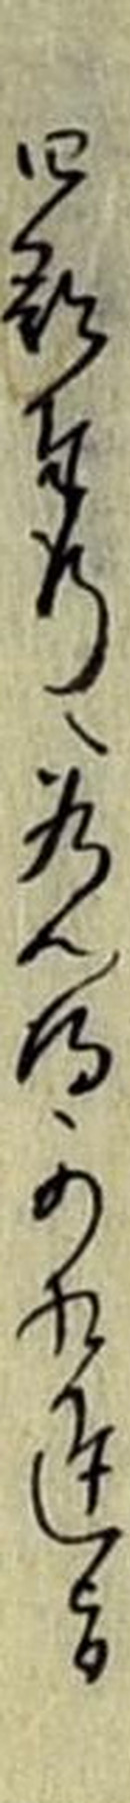四郡奉行へ為心得可相達旨
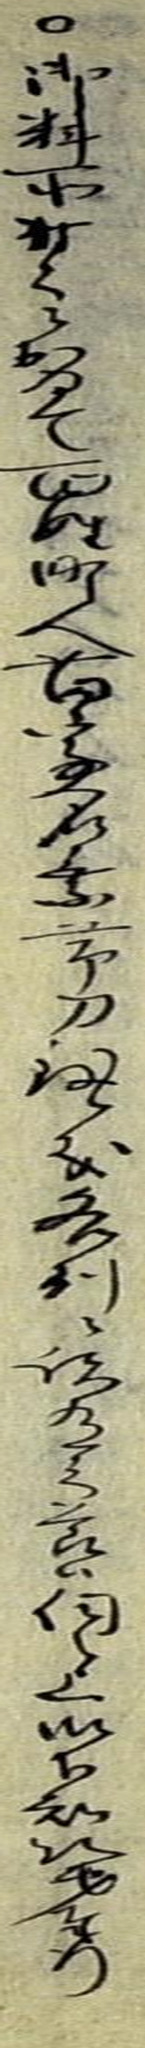〇御料所村々ニおゐて百姓町人苗字名乗帯刀致候義各別ニ訳有之節ハ伺之上御下知次第奉行
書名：命令之部 一
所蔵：福井県文書館 Fukui Prefectural Archives
